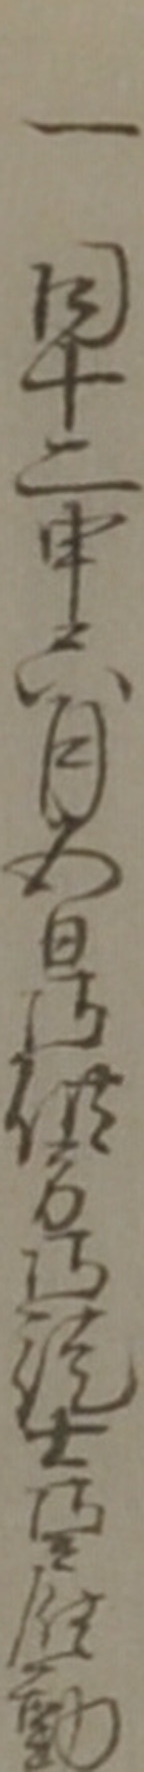一同十二申六月五日御供方御徒士御雇勤
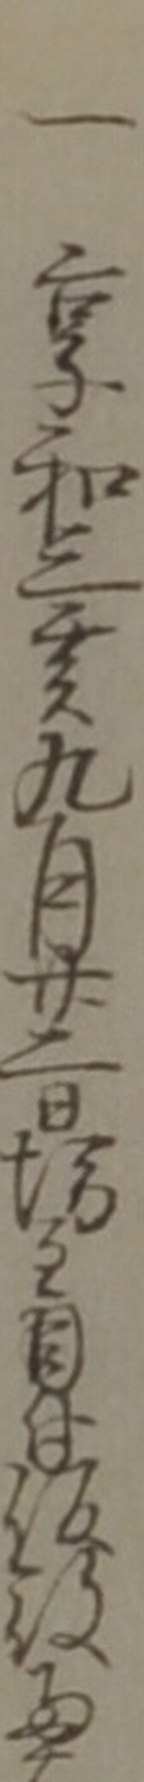一享和三亥九月廿二日坊主目付仮役奥勤
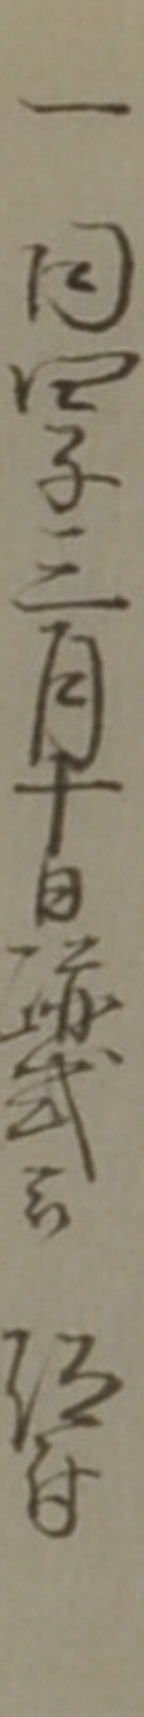一同四子三月十日跡式被仰付
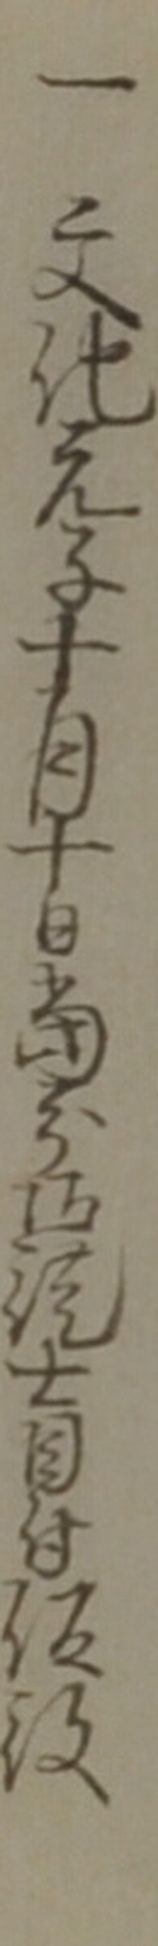一文化元子十月十日当分御徒士目付仮役
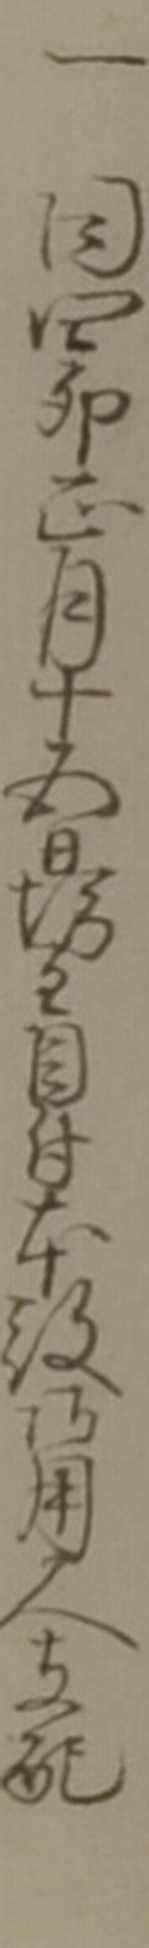一同四卯正月十五日坊主目付本役御用人支配
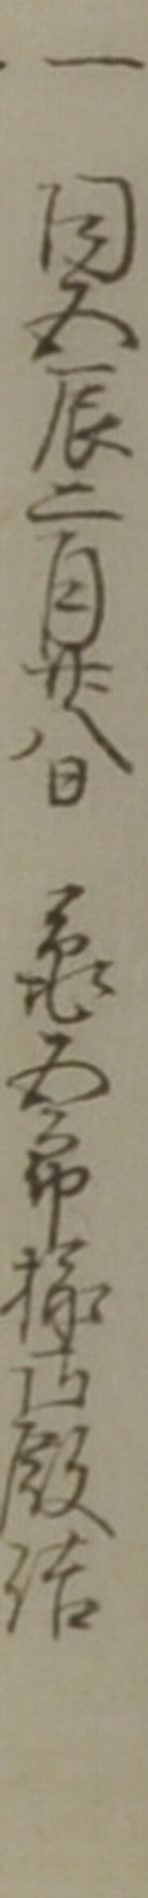一同五辰二月廿八日亀五郎様御殿詰
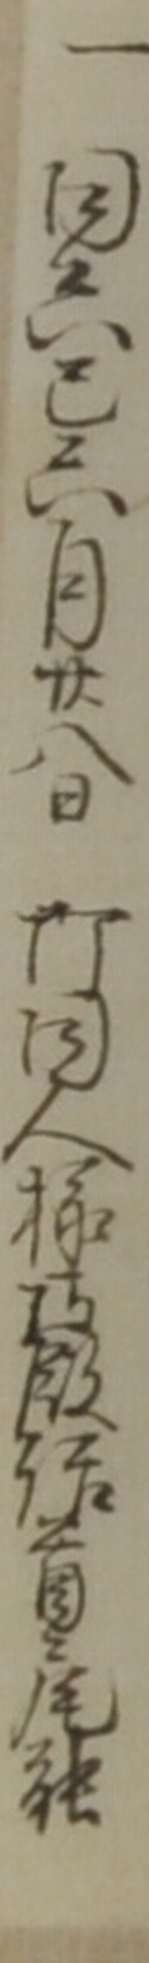一同六巳六月廿八日御同人様御殿詰首尾能

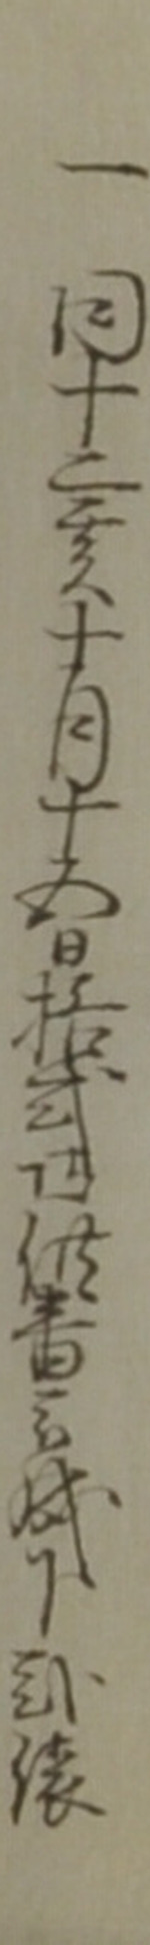一同十二亥十月十五日格式御供番被下弐俵
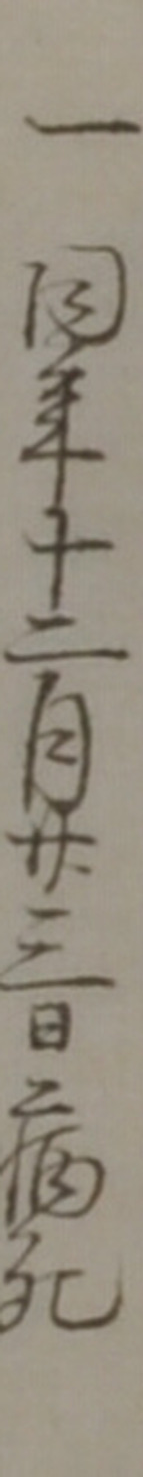一同年十二月廿三日病死
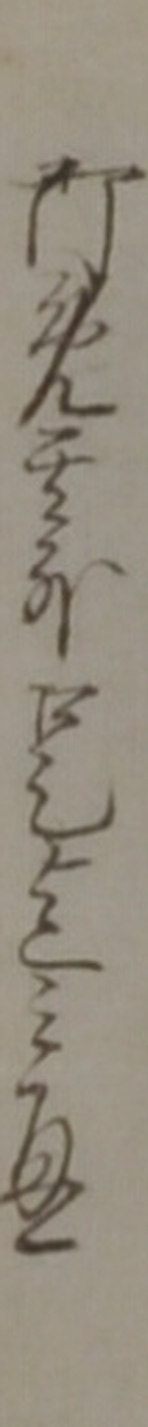御免其外是迄之通
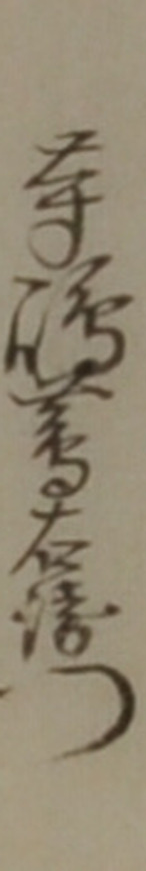寺嶋蔦右衛門
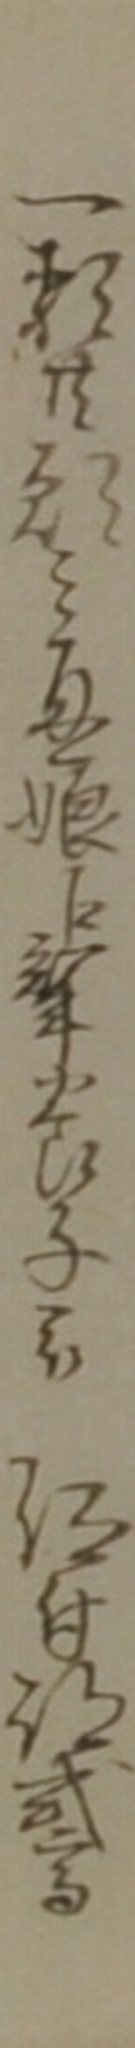一類共願之通娘江聟養子被仰付跡式高
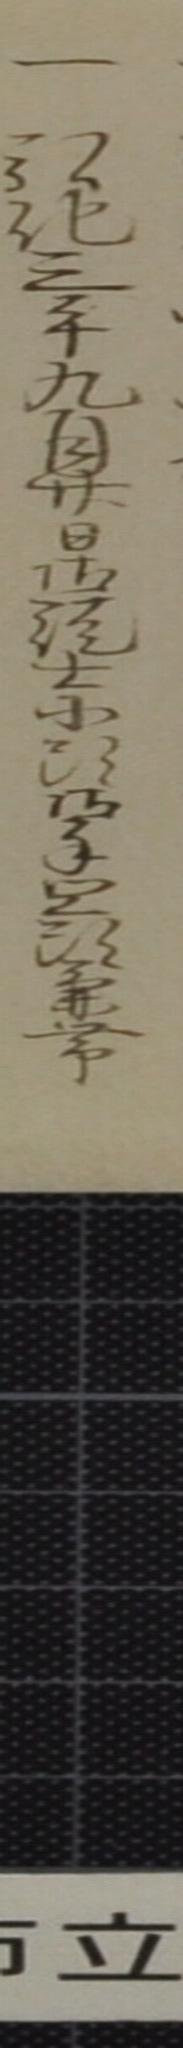一弘化三午九月廿日御徒士小頭御手頭兼帯
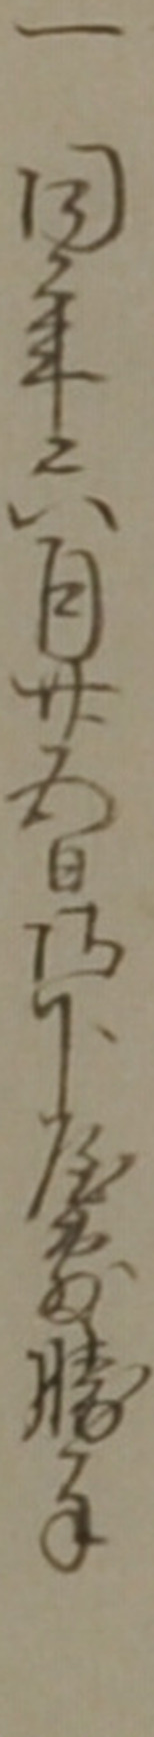一同年六月廿五日御下屋敷勝手
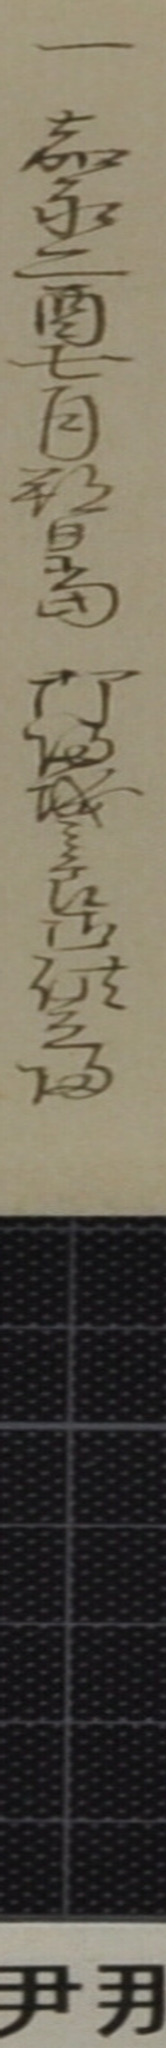一嘉永二酉七月朔日当御帰城之節御供立帰
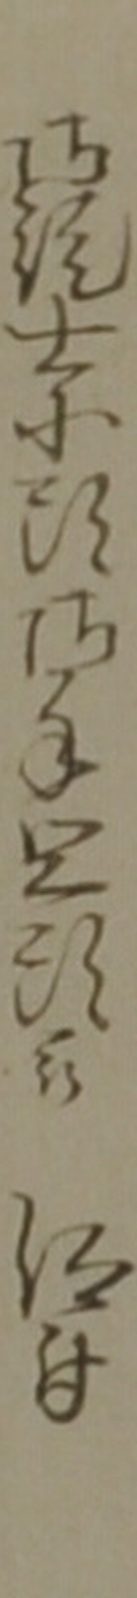御徒士小頭御手頭被仰付
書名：無足諸士勤仕録（五）
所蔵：伊那市立高遠町図書館・合同会社AMANE
